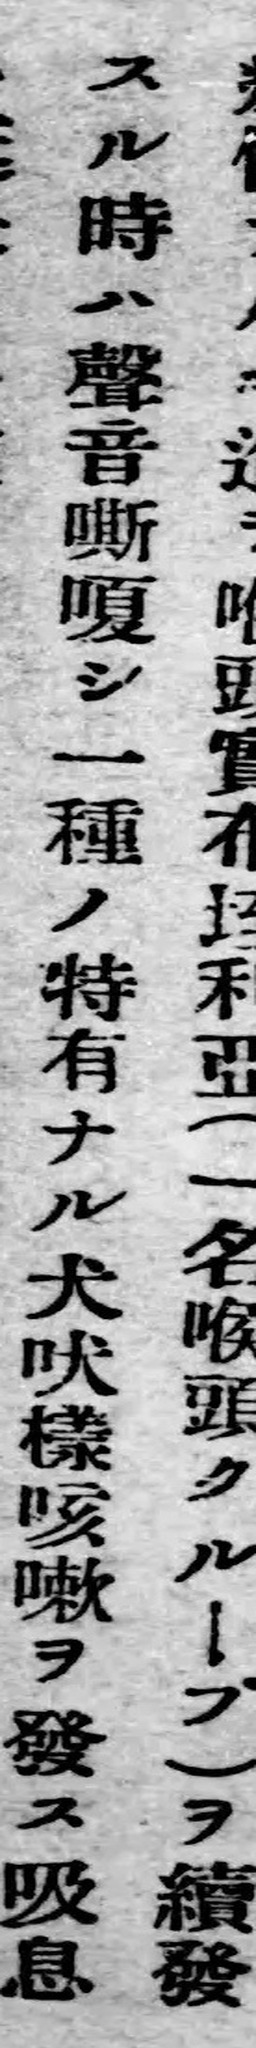スル時ハ聲音嘶嗄シ一種ノ特有ナル犬吠樣咳嗽ヲ發ス吸息
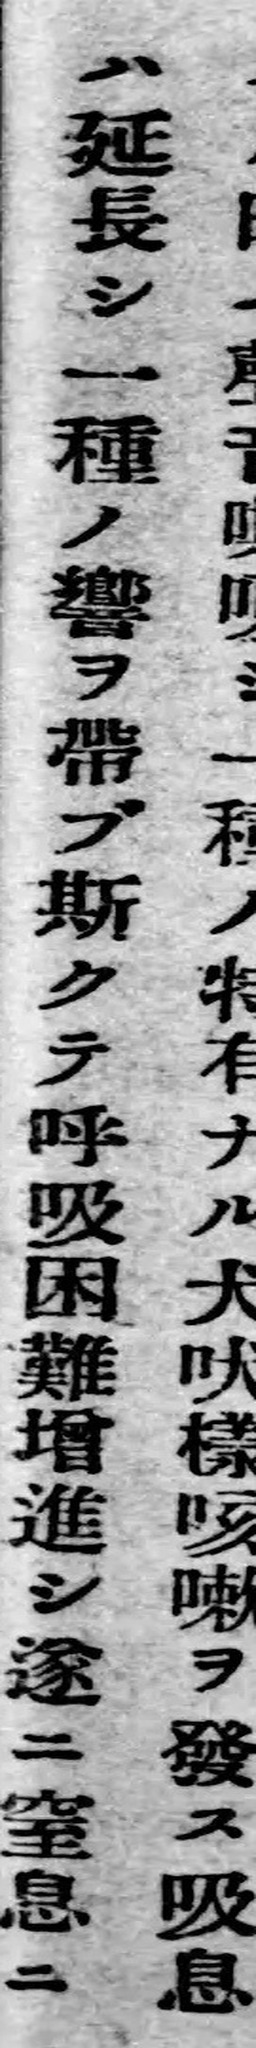ハ延長シ一種ノ響ヲ帶ブ斯クテ呼吸困難增進シ遂ニ窒息ニ
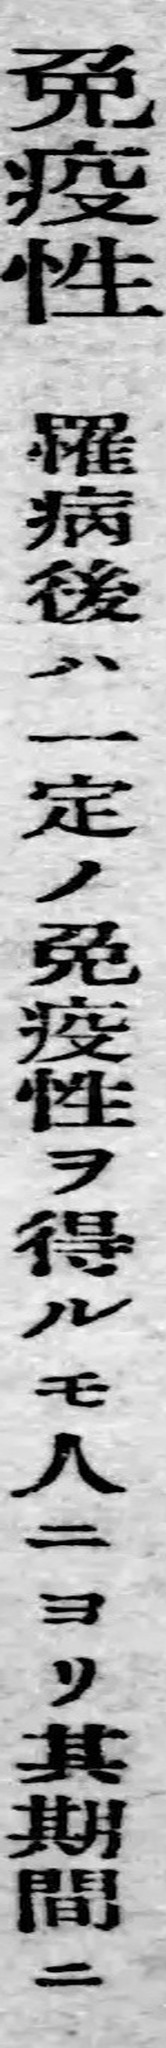免疫性罹病後ハ一定ノ免疫性ヲ得ルモ人ニヨリ其期間ニ
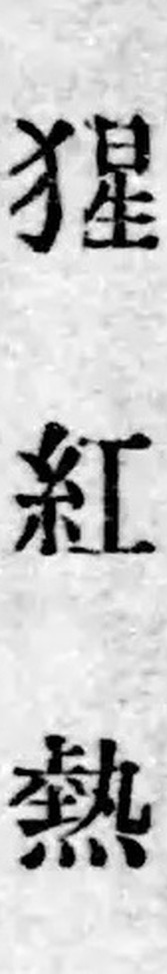猩紅熱
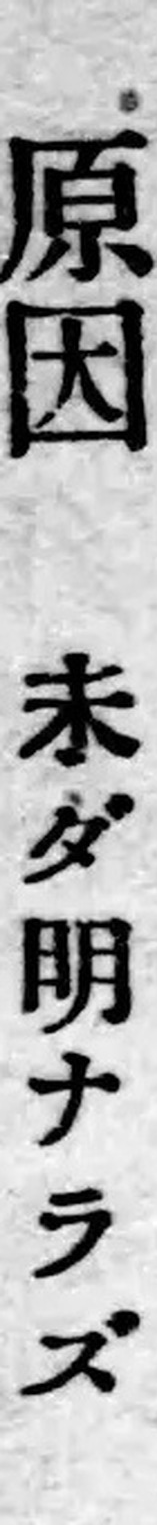原因未ダ明ナラズ
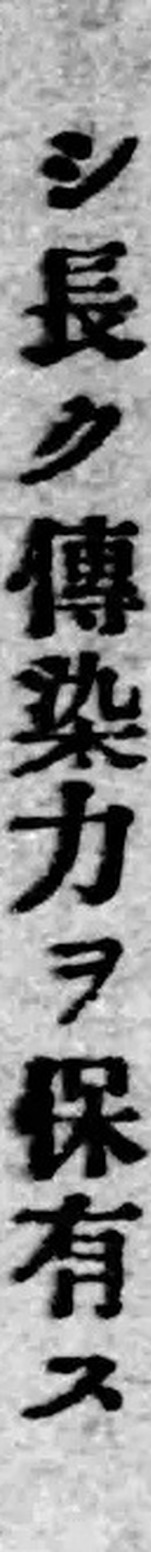シ長ク傳染力ヲ保有ス

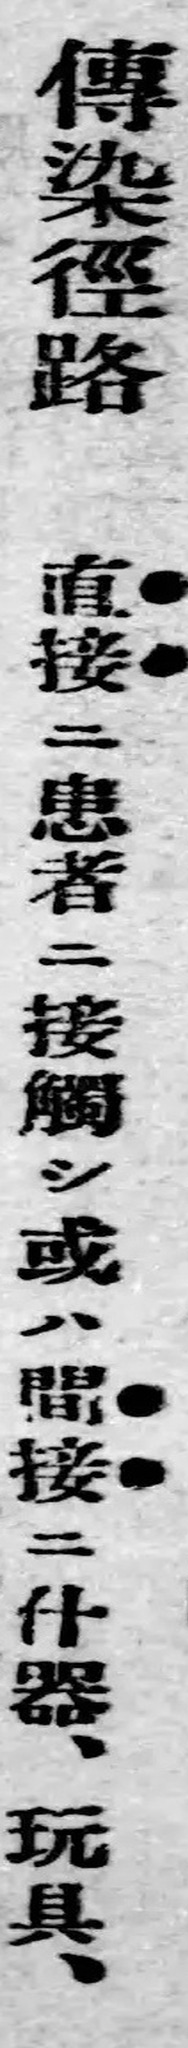傳染徑路直接ニ患者ニ接觸シ或ハ間接ニ什器、玩具、
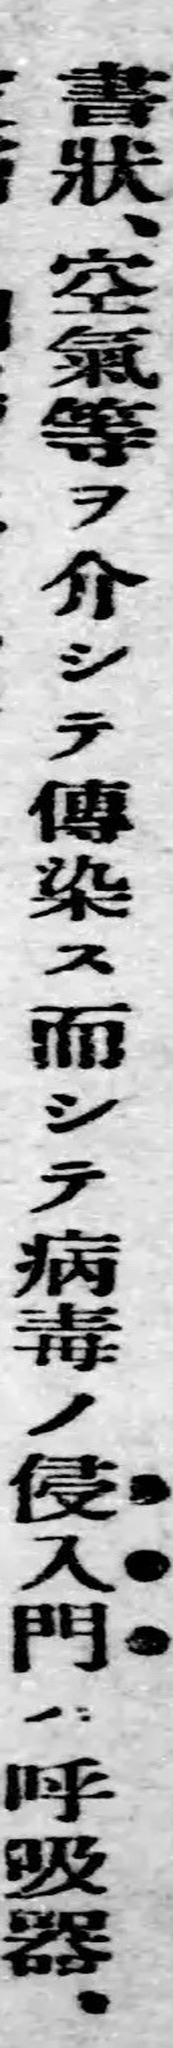書状、空氣等ヲ介シテ傳染ス而シテ病毒ノ侵入門ハ呼吸器、
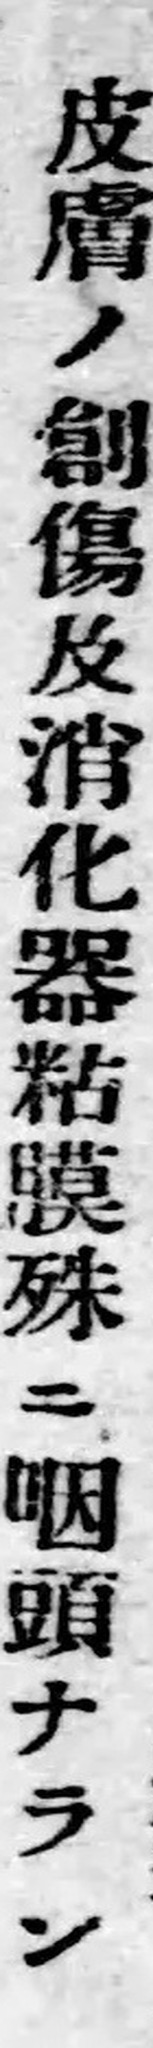皮膚ノ創傷及消化器粘膜殊ニ咽頭ナラン
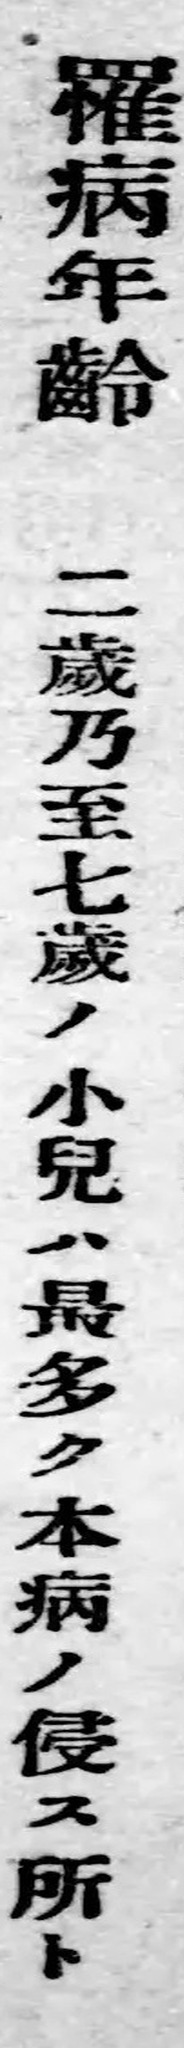罹病年齢二歳乃至七歳ノ小兒ハ最多ク本病ノ侵ス所ト
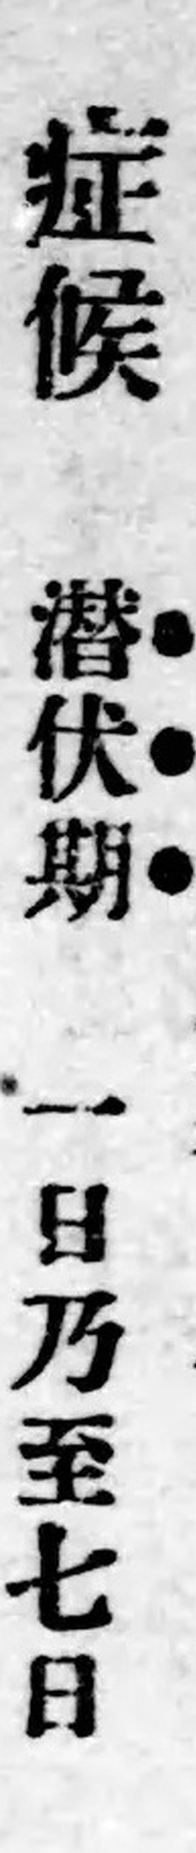症候潜伏期一日乃至七日
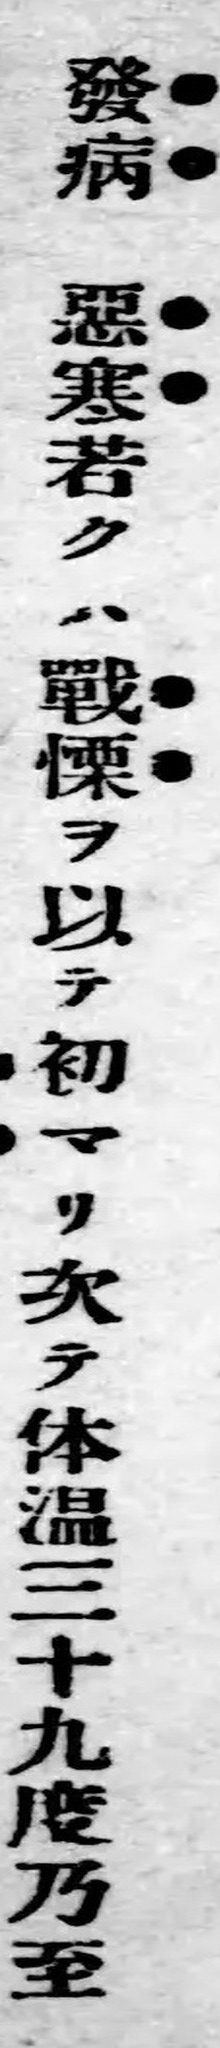發病惡寒若クハ戰慄ヲ以テ初マリ次テ体温三十九度乃至
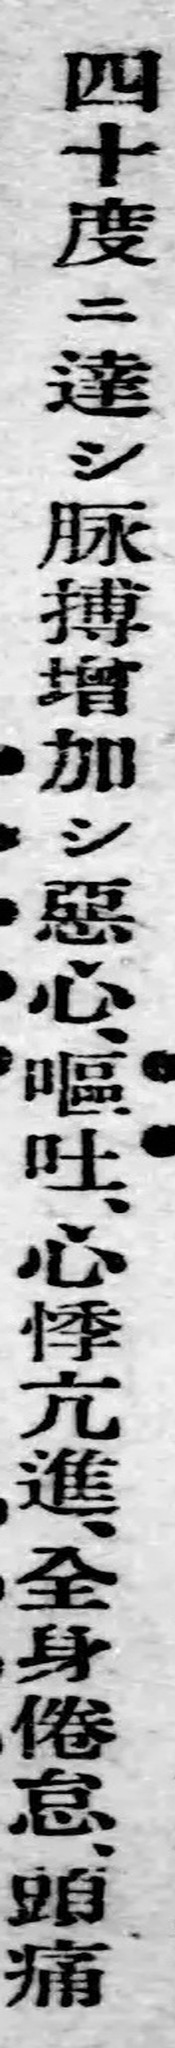四十度ニ達シ脈搏增シ惡心、嘔吐、心悸亢進、全身倦怠、頭痛
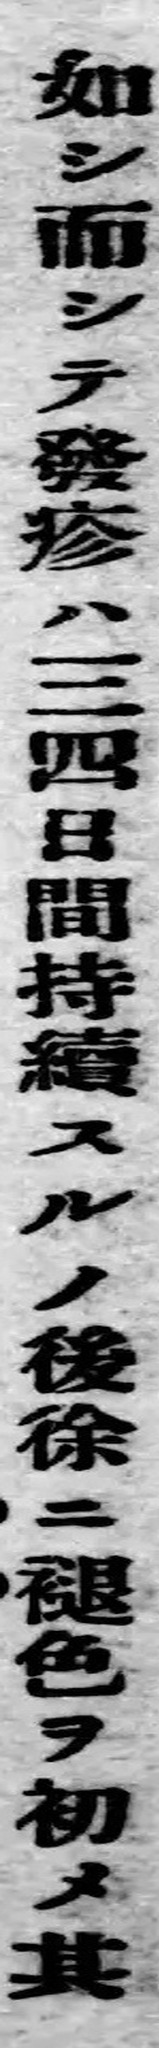如シ而シテ發疹ハ三四日間持續スルノ後徐ニ褪色ヲ初メ其
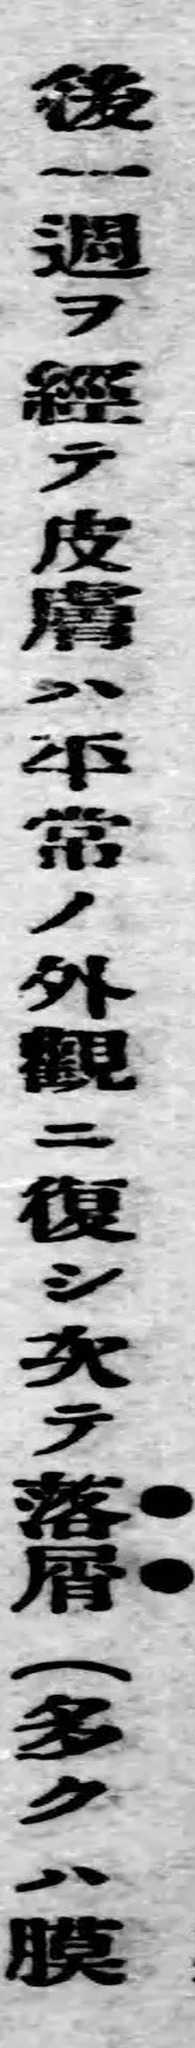後一週ヲ經テ皮膚ハ平常ノ外觀ニ復シ次テ落屑(多クハ膜
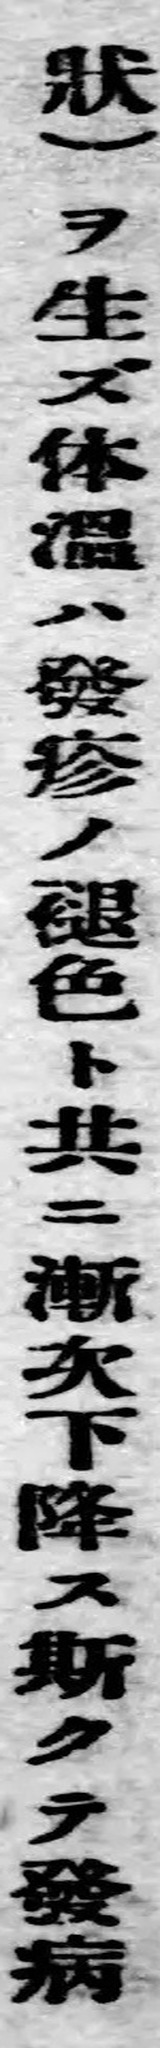狀)ヲ生ズ体溫ハ發疹ノ褪色ト共ニ漸次下降ス斯クテ發病
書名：袖珍防疫必携
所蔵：国立国会図書館 National Diet Library, JAPAN
